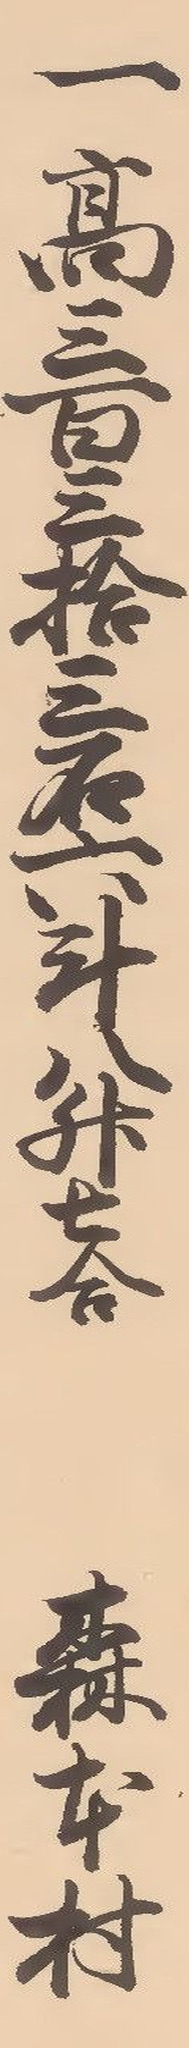一高三百三拾三石六斗八升七合森本村
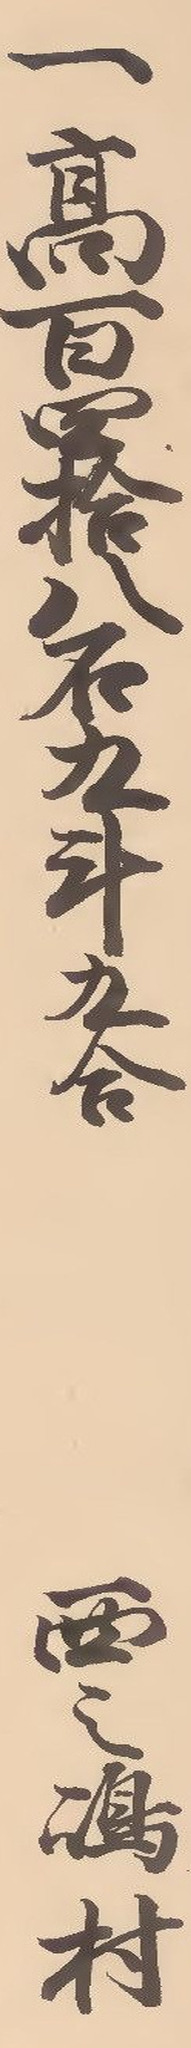一高百四拾八石九斗九合西之島村
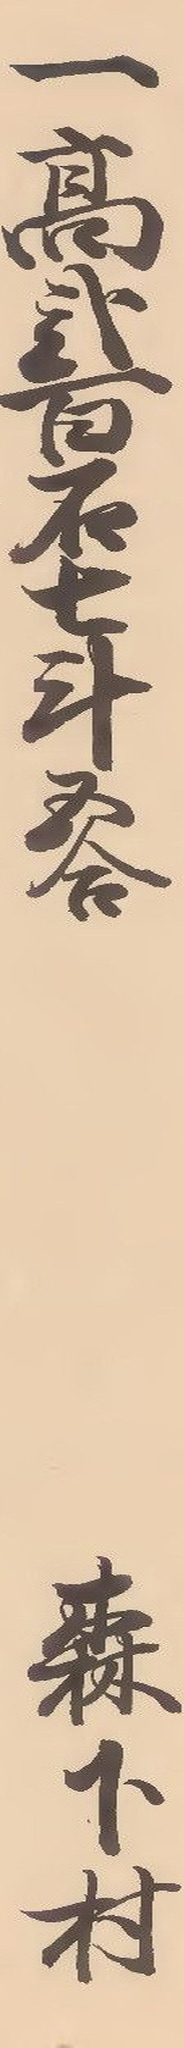一高弐百石七斗五合森下村
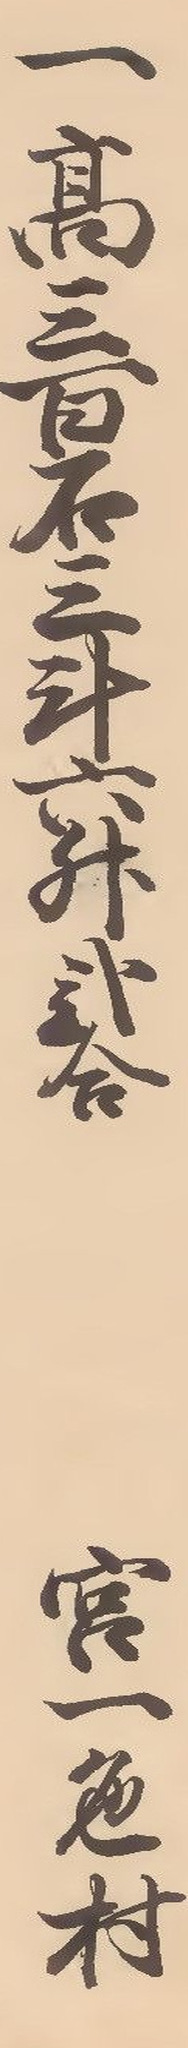一高三百石三斗六升弐合宮一色村
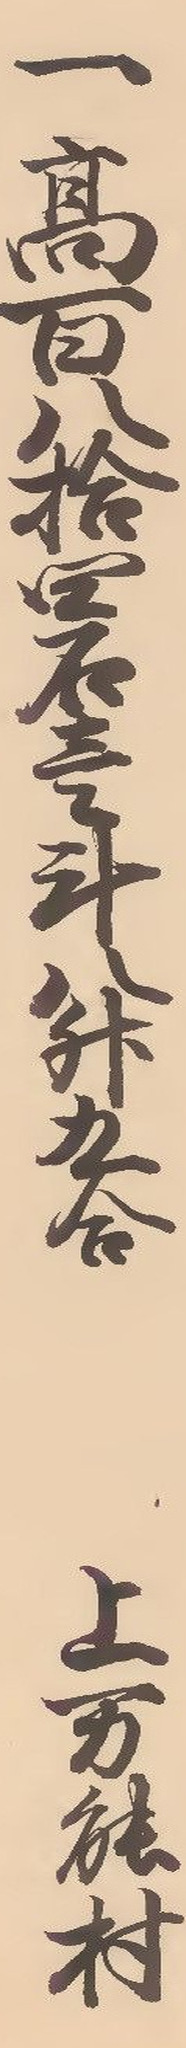一高百八拾四石壱斗八升九合上万能村

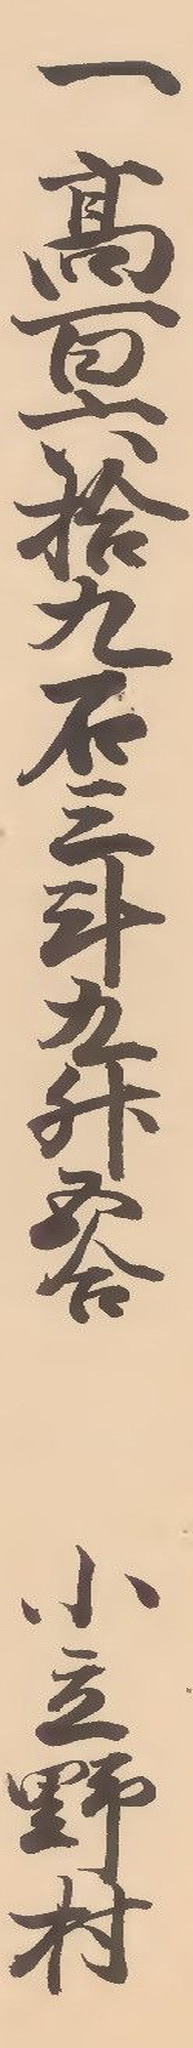一高百六拾九石三斗九升五合小立野村
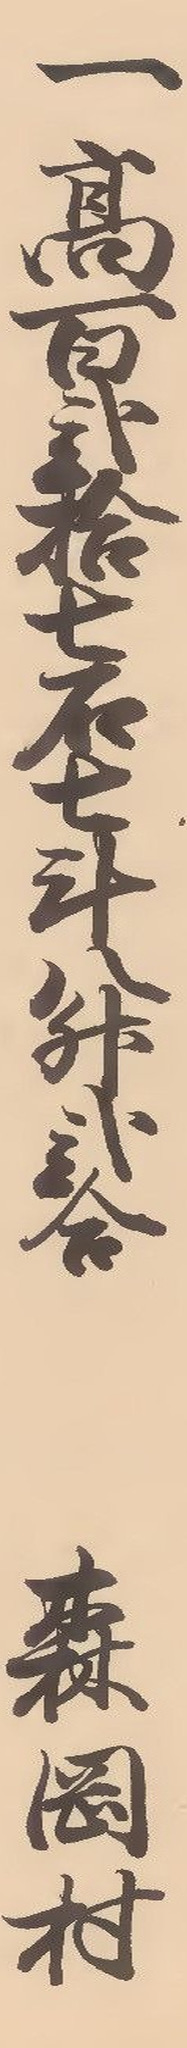一高百弐拾七石七斗八升弐合森岡村
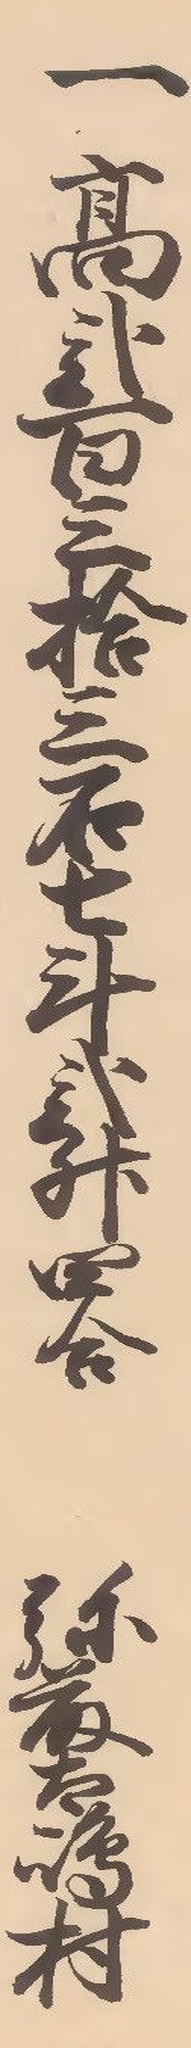一高弐百三拾三石七斗弐升四合弥藤太島村
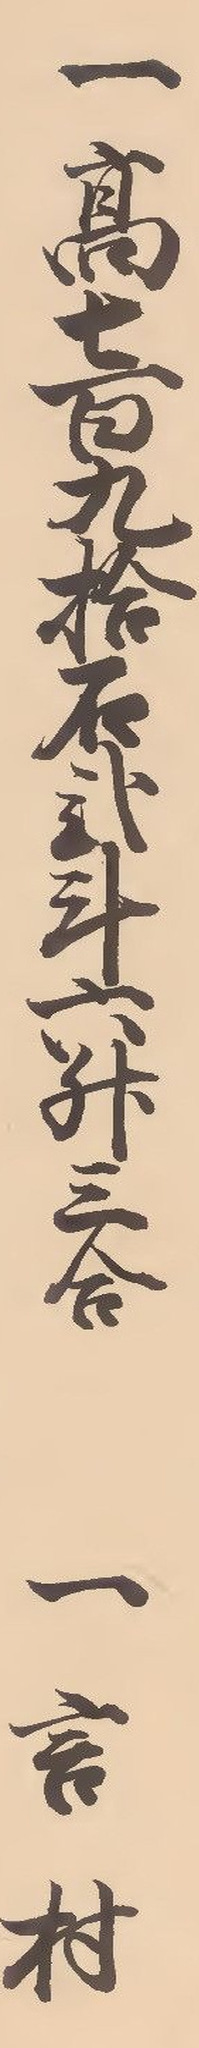一高七百九拾石弐斗六升三合一言村
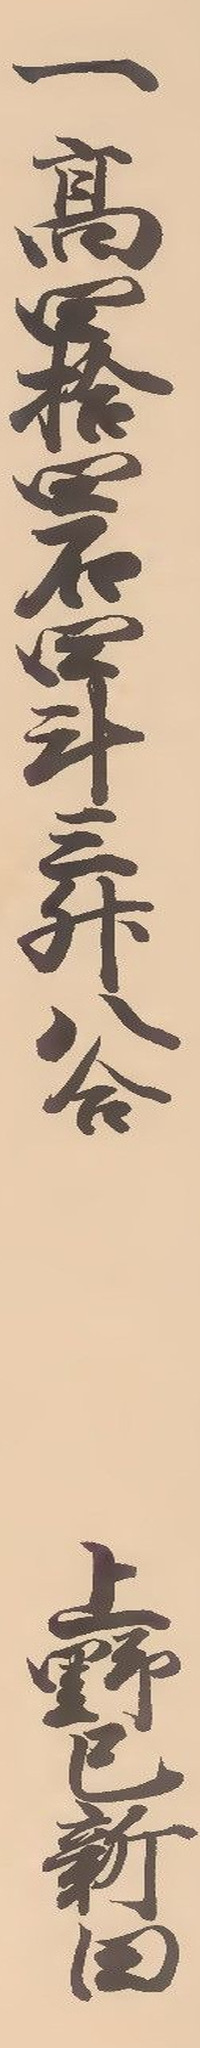一高四拾四石四斗三升八合上野巳新田
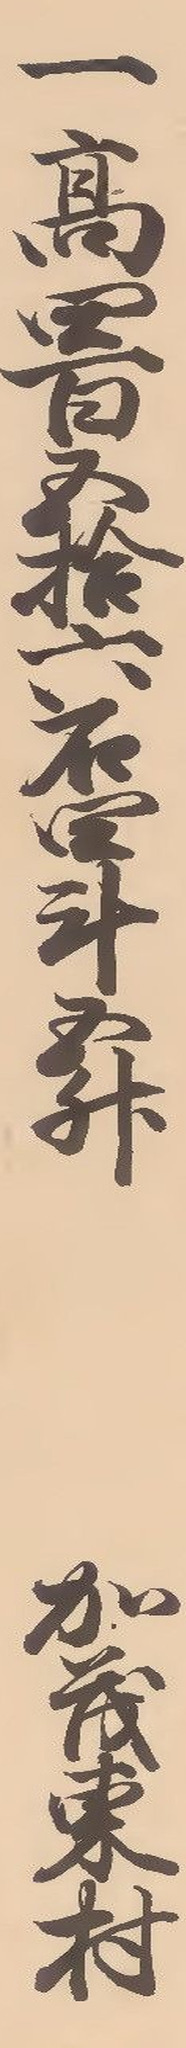一高四百五拾六石四斗五升加茂東村
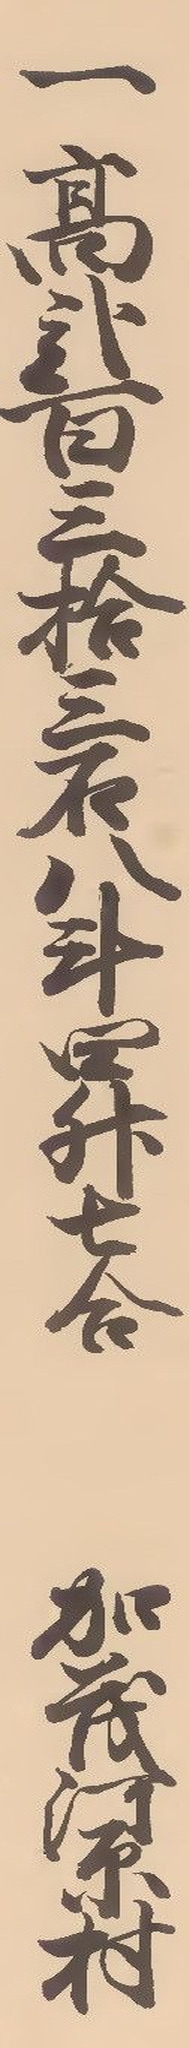一高弐百三拾三石八斗四升七合加茂河原村
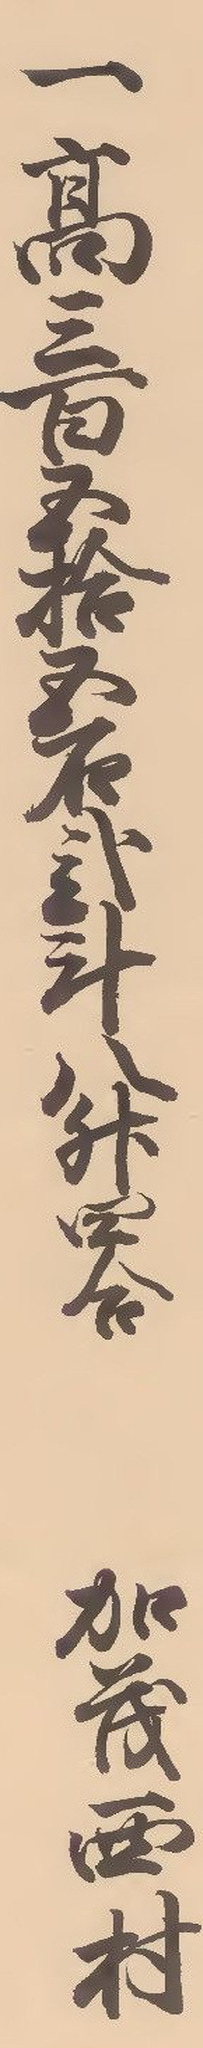一高三百五拾五石弐斗八升四合加茂西村

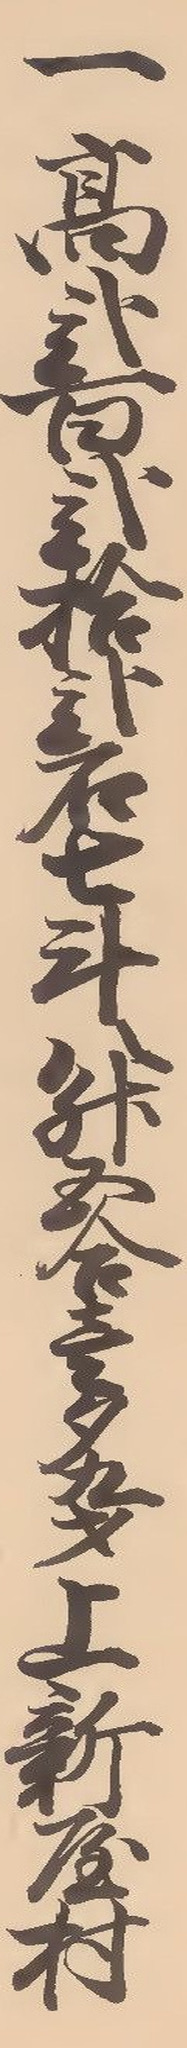一高弐百弐拾弐石七斗八升五合壱勺九才上新屋村
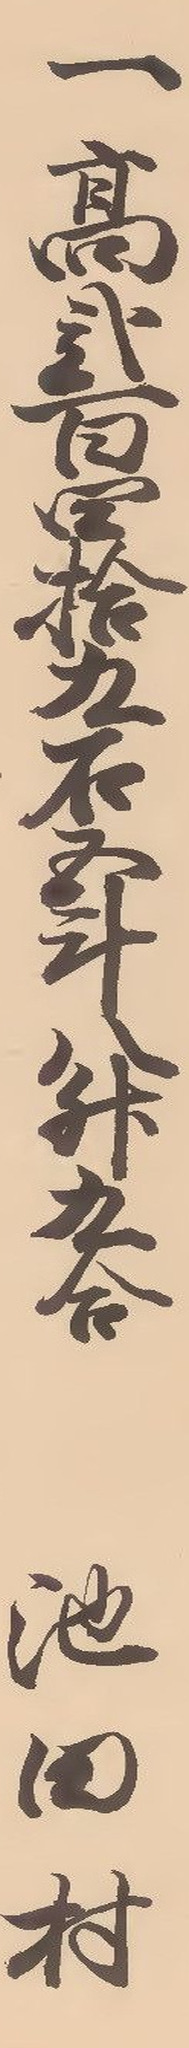一高弐百四拾九石五斗八升九合池田村
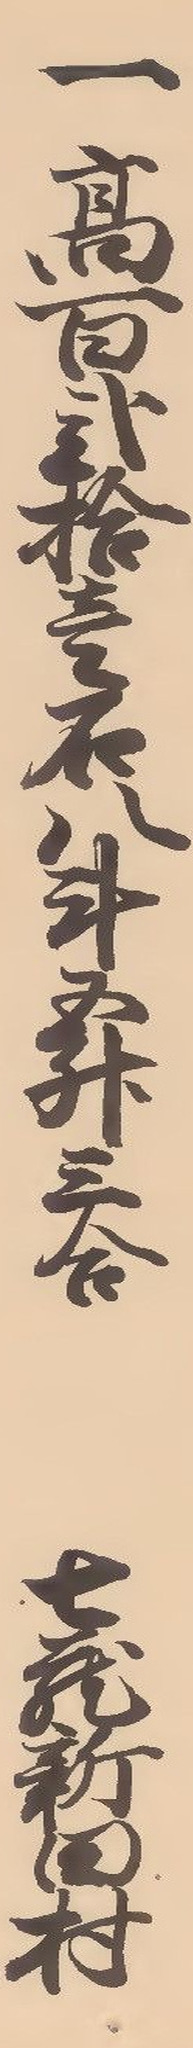一高百弐拾壱石八斗五升三合七蔵新田村
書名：遠江国郷帳
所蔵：国立公文書館 National Archives of Japan
